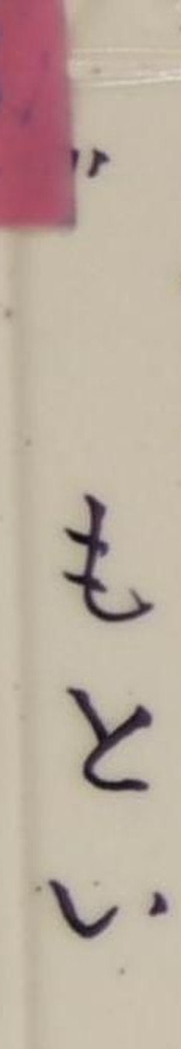もとい
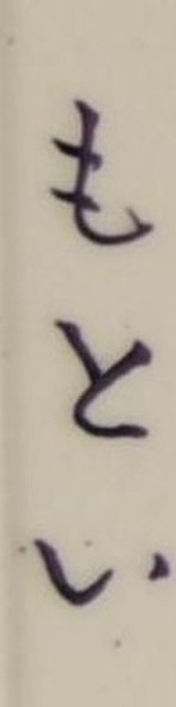もとい

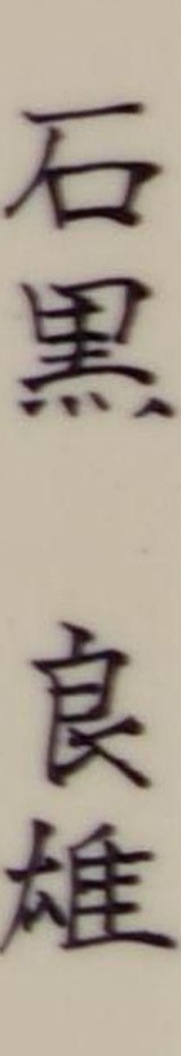石黒良雄
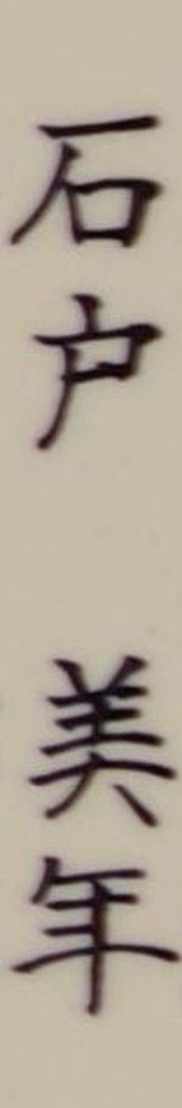石戸美年
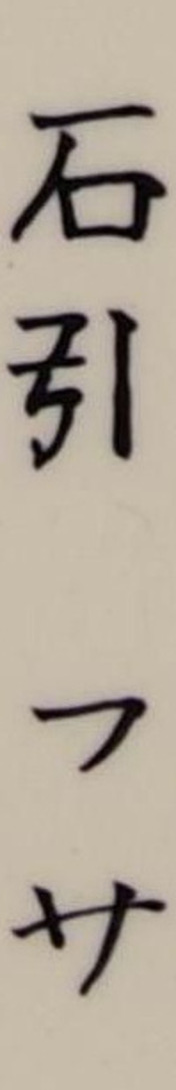石引フサ
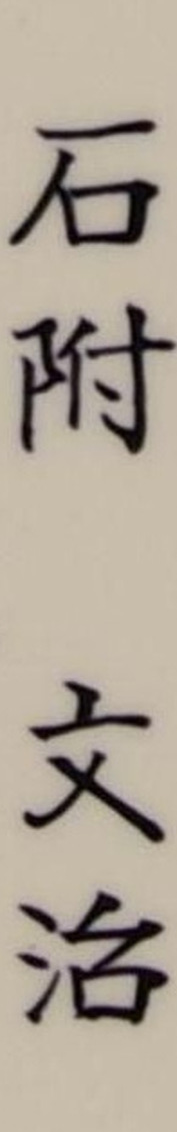石附文治
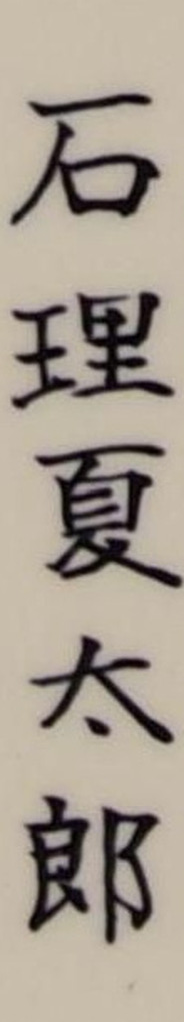石理夏太郎
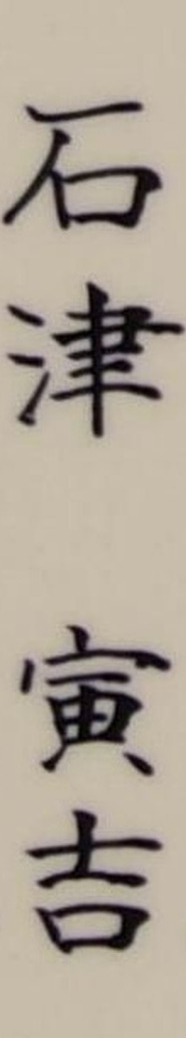石津寅吉
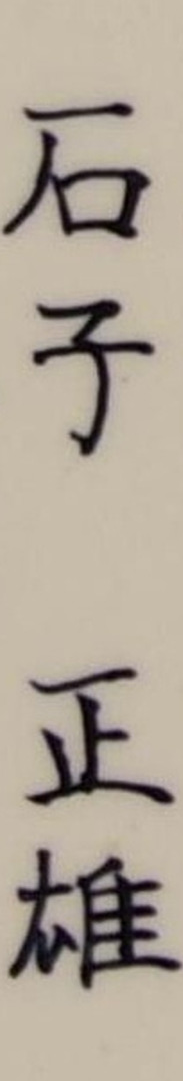石子正雄
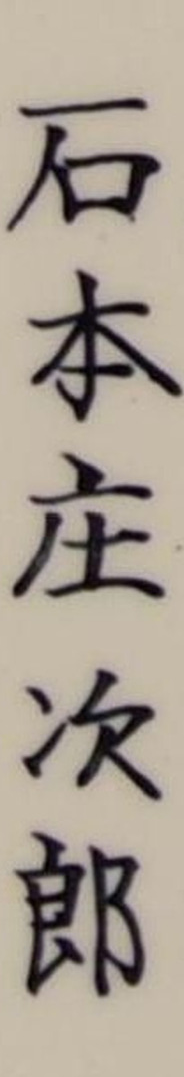石本庄次郎
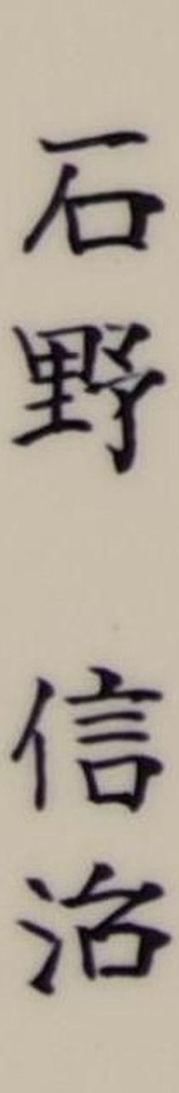石野信治
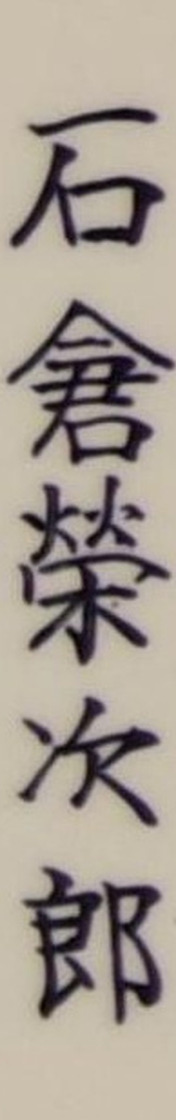石倉栄次郎
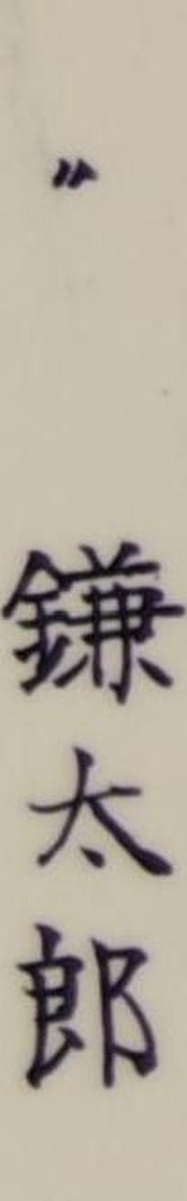鎌太郎
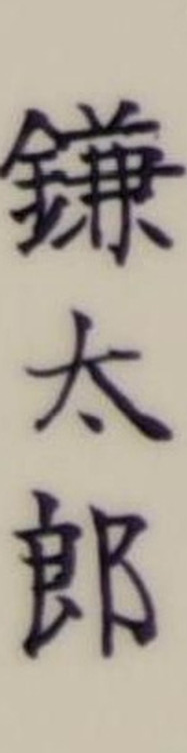鎌太郎
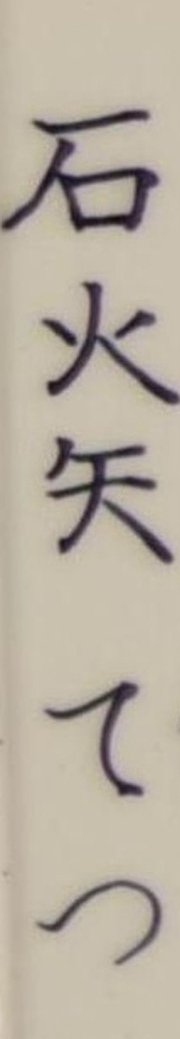石火矢てつ

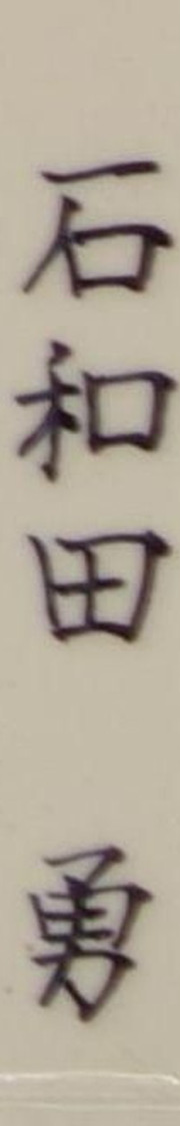石和田勇
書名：M~S
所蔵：高野山金剛峯寺
